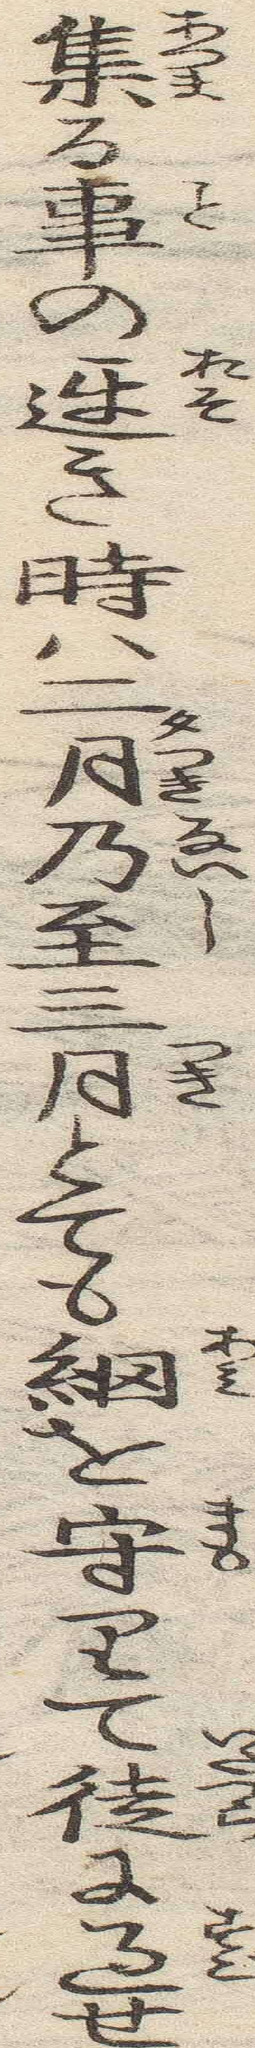集る事の遅き時は二月乃至三月とても網を守りて徒に過せ
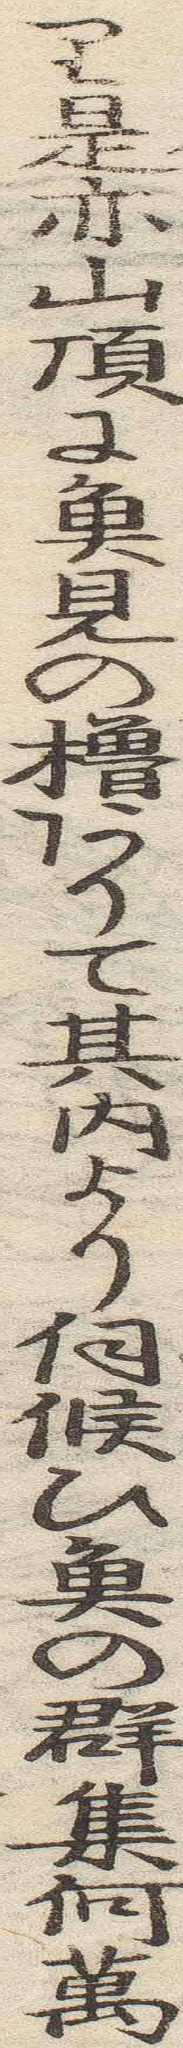り是亦山頂に魚見の櫓ありて其内より伺候ひ魚の群集何万
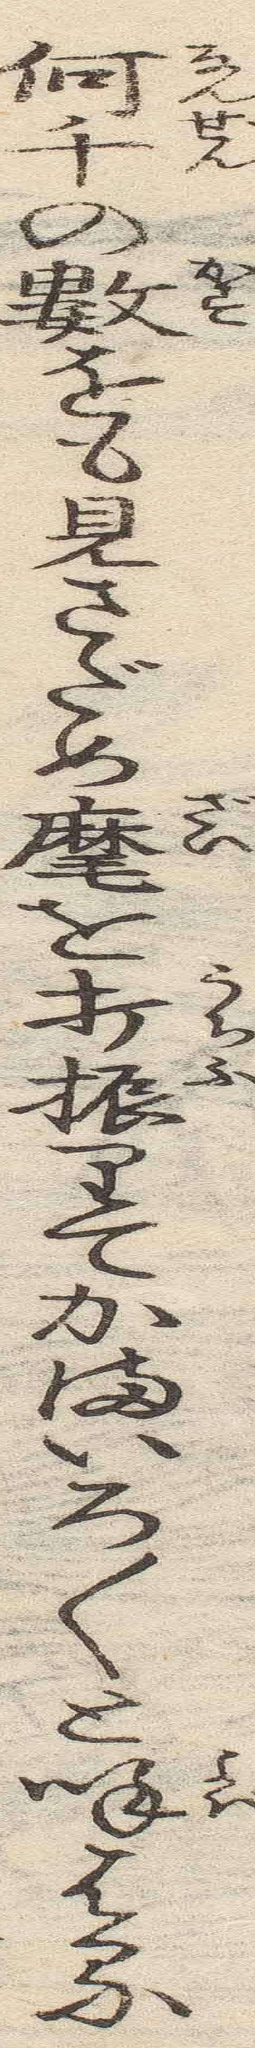何千の数をも見さだめ麾を打振りてかまいろ〳〵と呼はる
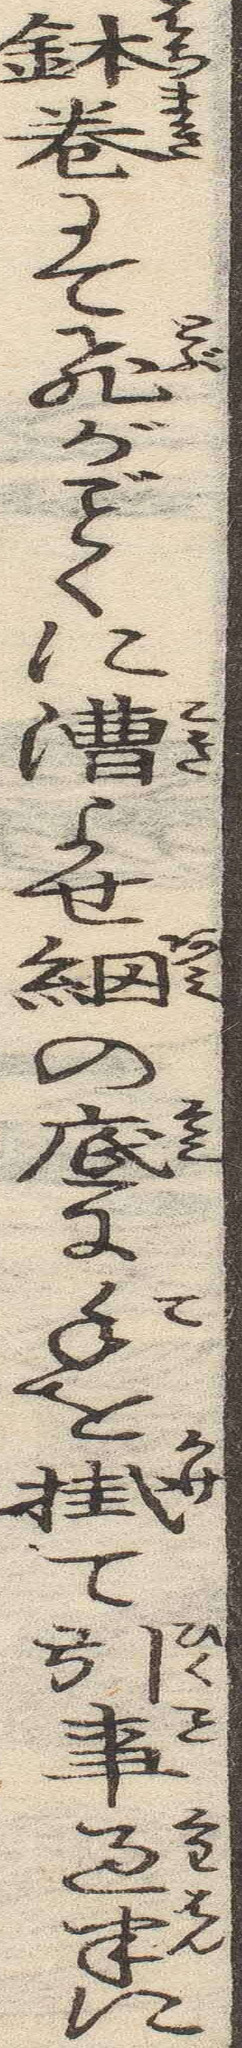鉢巻にて飛がごとくに漕よせ網の底に手を掛て引事過半に
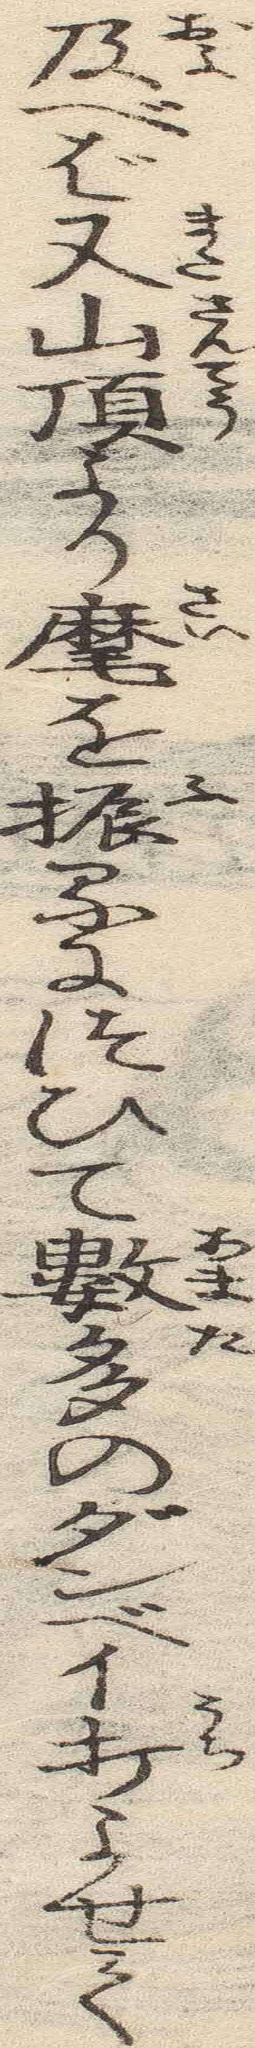及べば又山頂より麾を振るにつひて数多のダンベイ打よせて
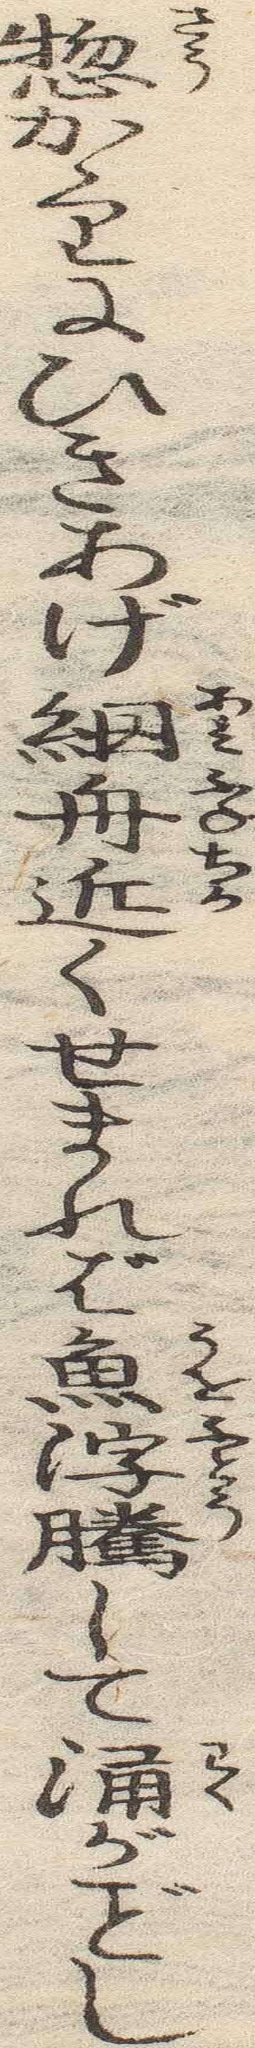惣かゝりにひきあげ網舟近くせまれば魚浮騰して湧がごとし
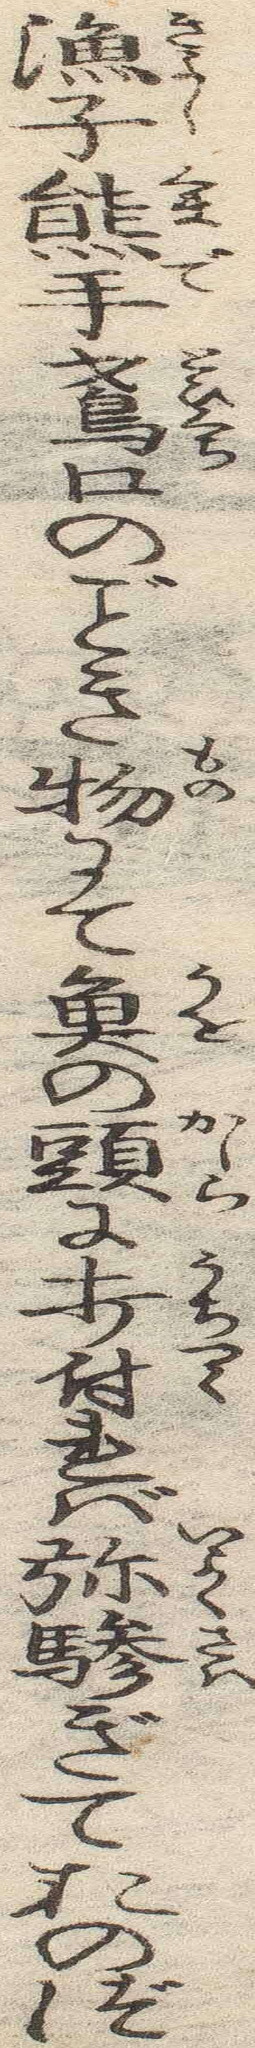漁子熊手鳶口のごとき物にて魚の頭に打付れば弥驂ぎたておのづ
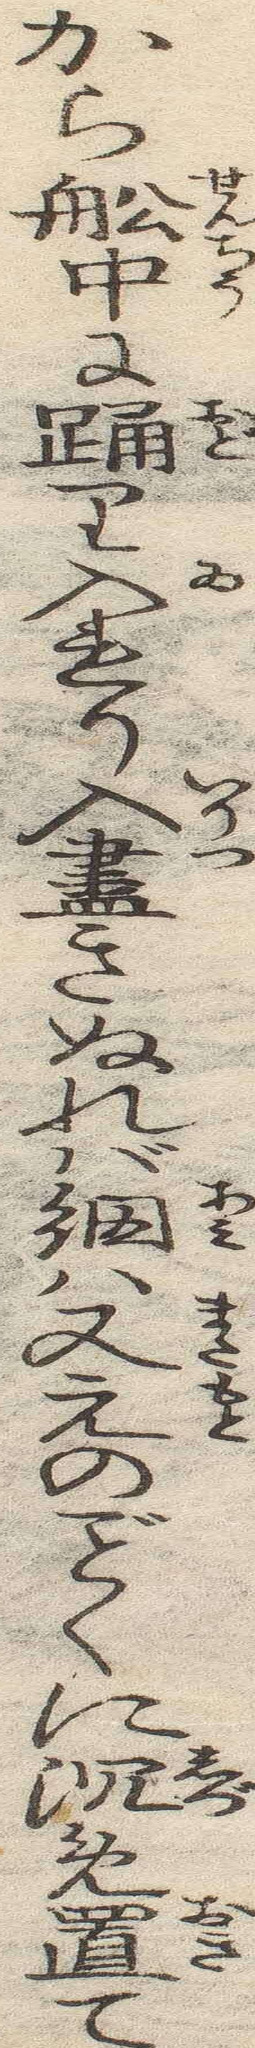から船中に踊り入れり入尽きぬれば網は又元のごとくに沈め置て
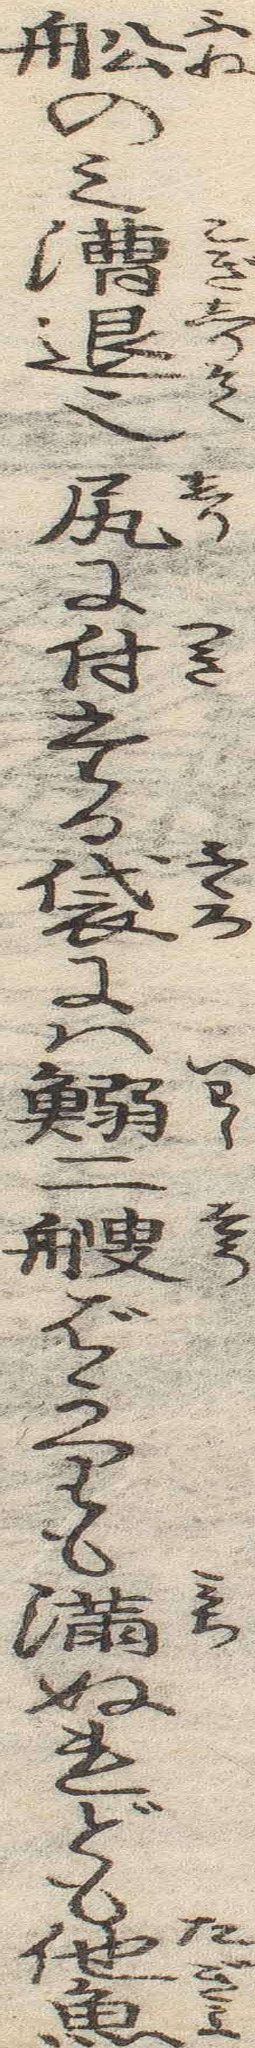船のみ漕退也尻に付たる袋には鰯二艘ばかりも満ぬれども他魚
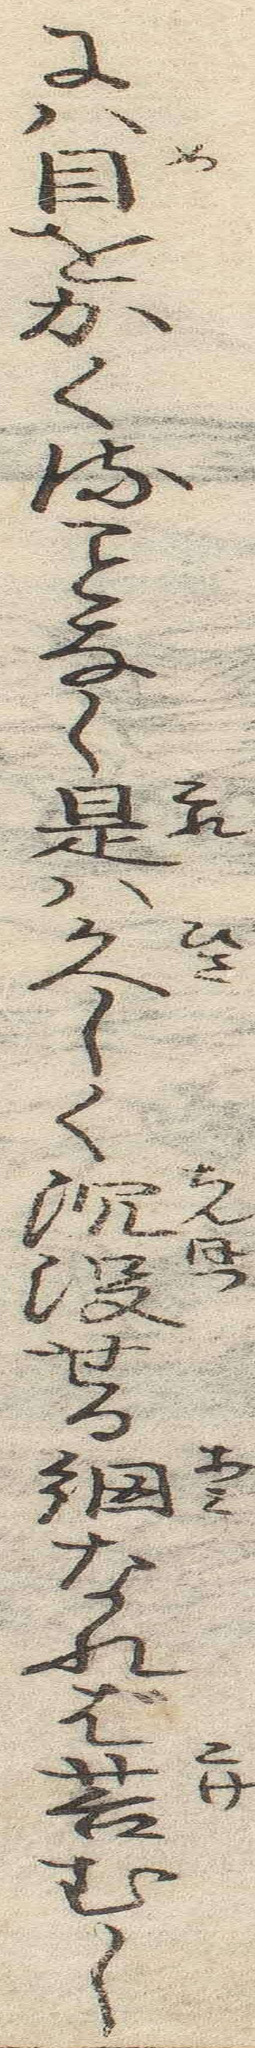には目をかくることなし是は久しく沈没せる網なれば苔むし
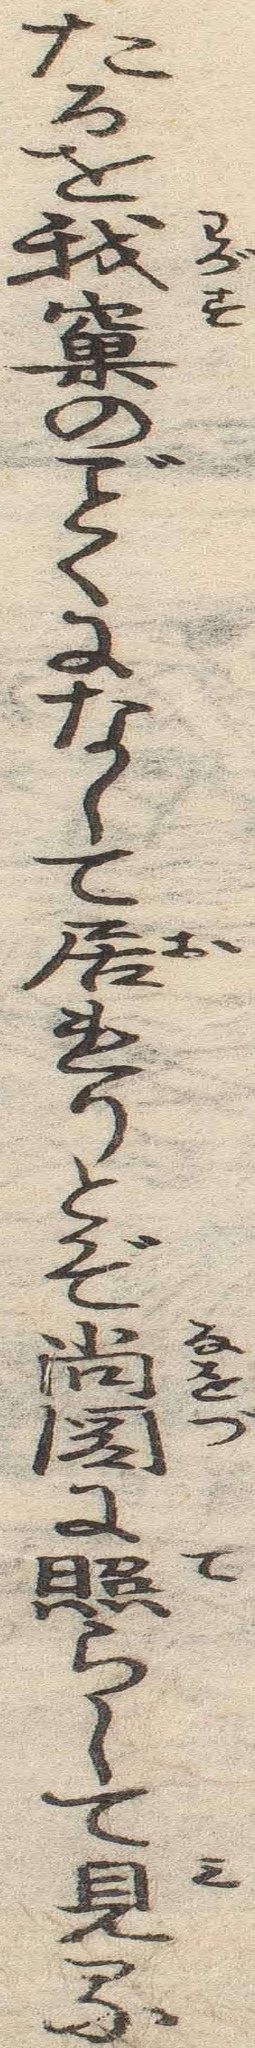たるを我巣のごとくになして居れりとぞ尚図に照らして見る
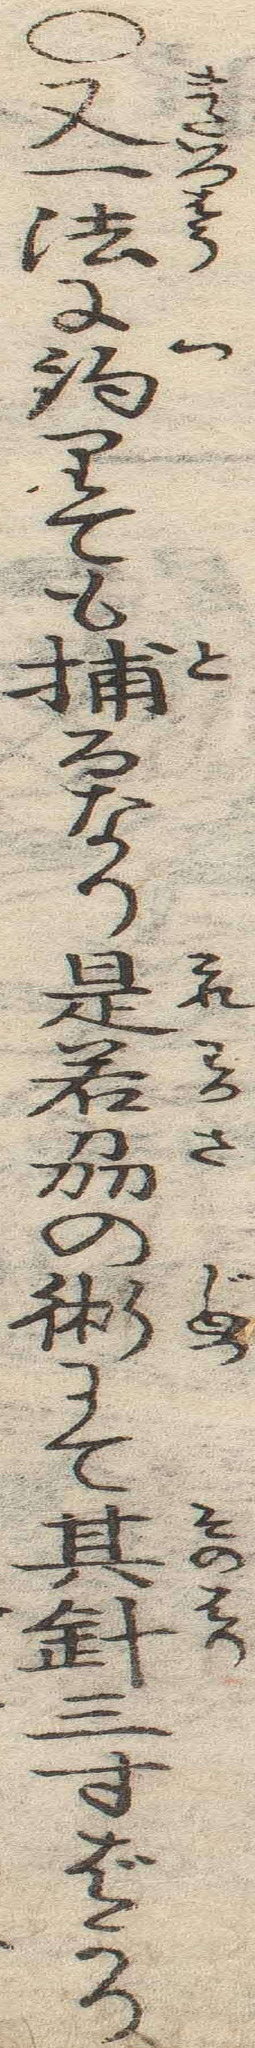○又一法に釣りても捕るなり是若州の術にて其針三寸ばかり
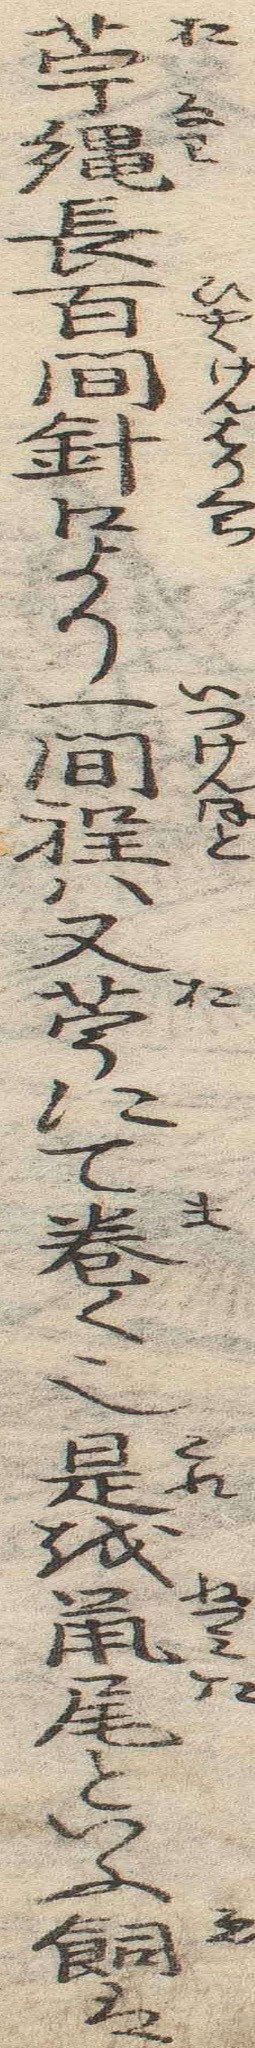荢縄長百間針口より一間程は又荢にて巻く也是を鼠尾といふ飼は
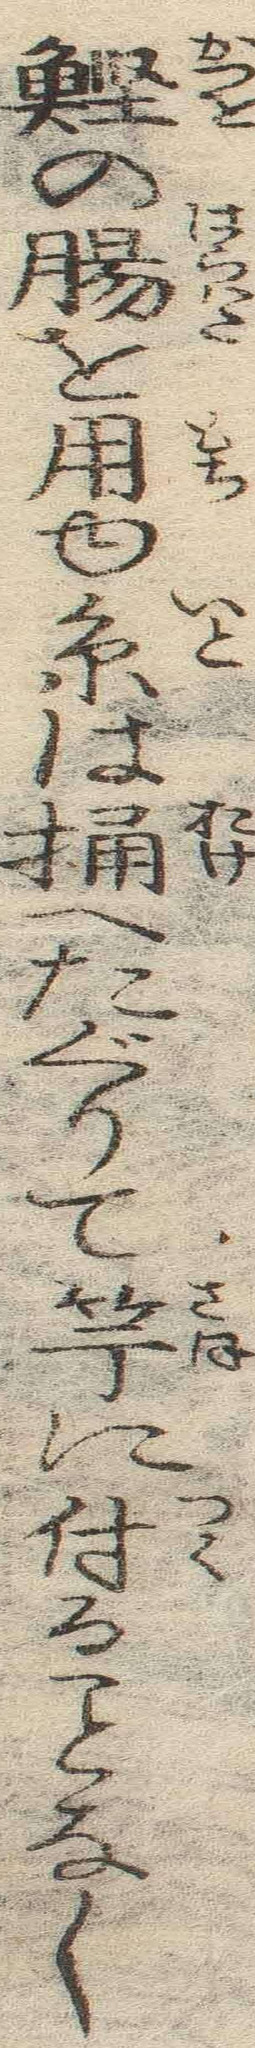鰹の腸を用ゆ糸は桶へたぐりて竿に付ることなし
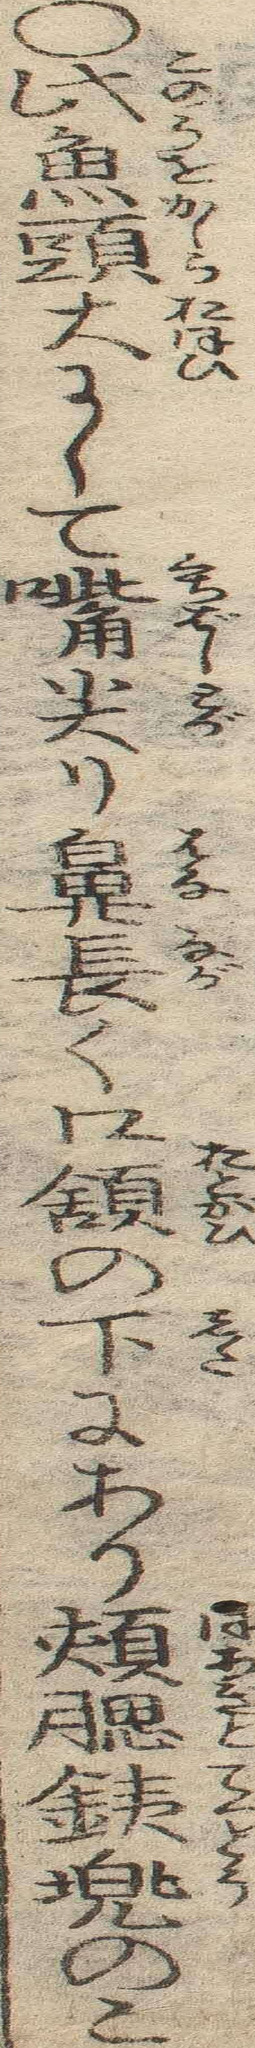○此魚頭大にして嘴尖り鼻長く口頜の下にあり頬腮鉄兜のこ

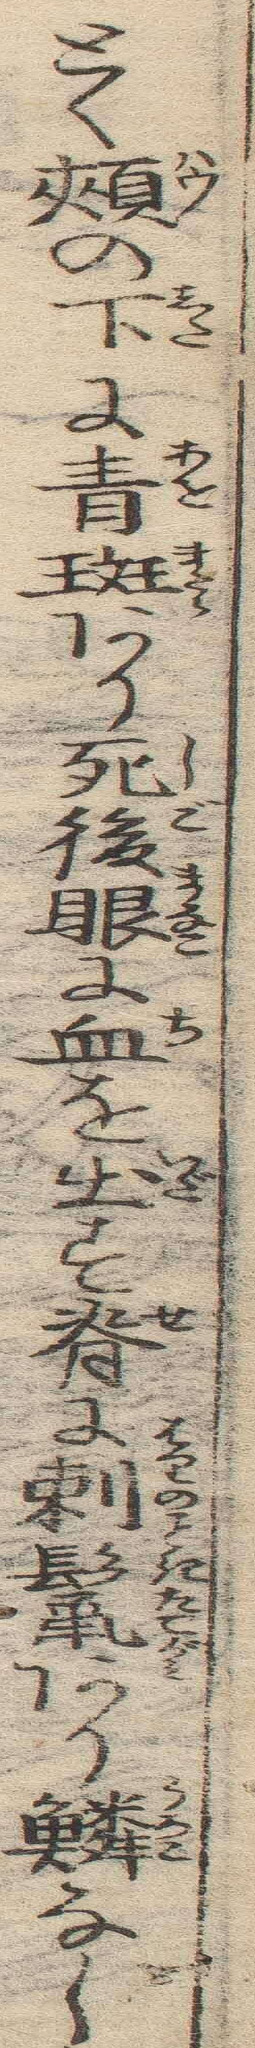とく頬の下に青斑あり死後眼に血を出す脊に刺鬣あり鱗なし
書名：日本山海名産図会
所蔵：東京学芸大学附属図書館 国文学研究資料館
